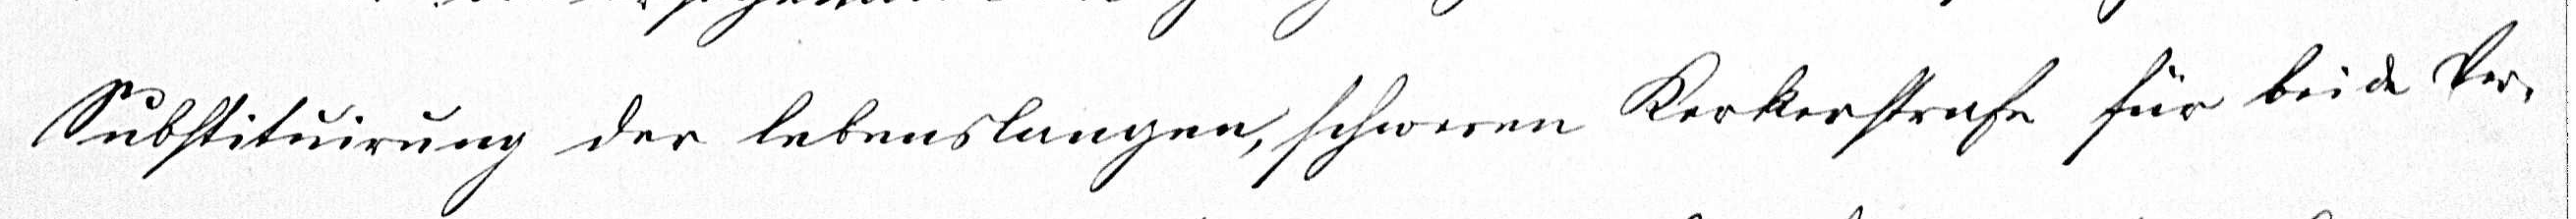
Substituirung der lebenslangen, schweren Kerkerstrafe für beide Ver¬
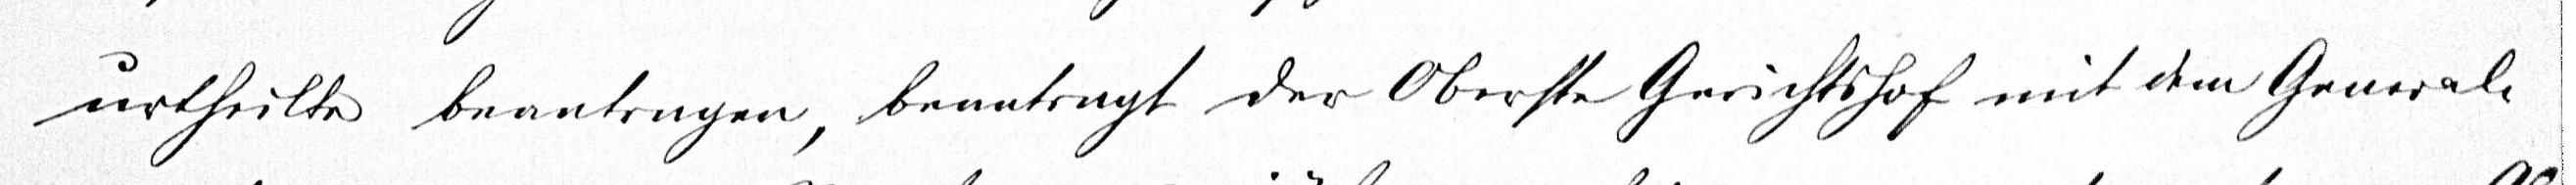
urtheilte beantragen, beantragt der Oberste Gerichtshof mit dem General¬
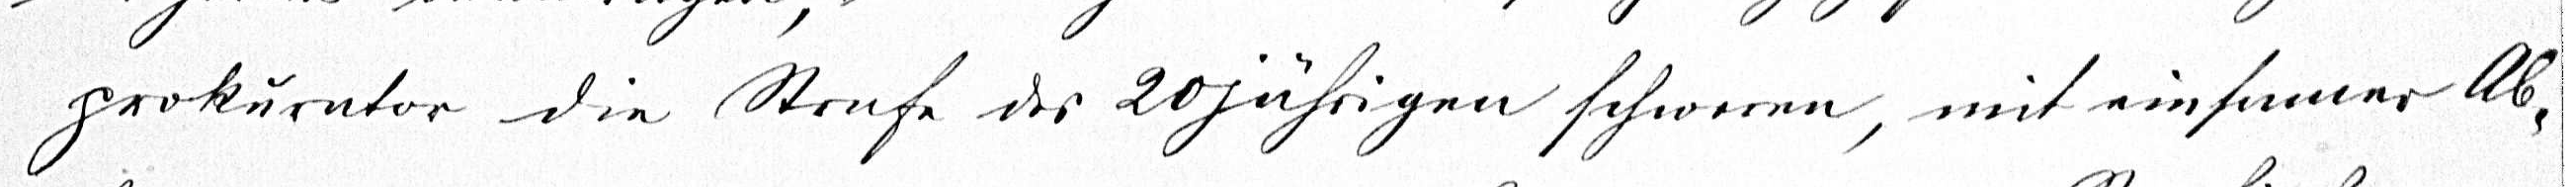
prokurator die Strafe des 20jährigen schweren, mit einsamer Ab¬
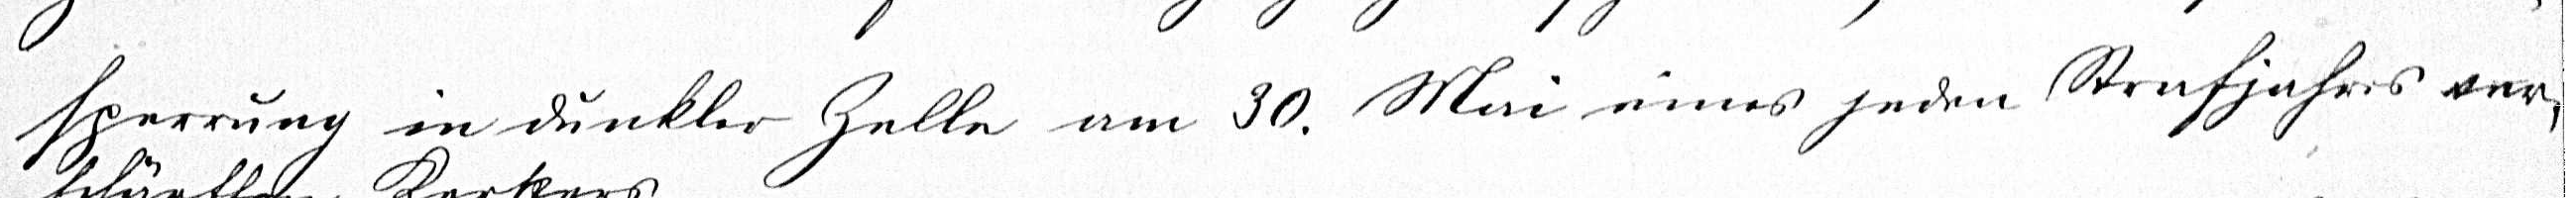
sperrung in dunkler Zelle am 30. Mai eines jeden Strafjahres ver¬
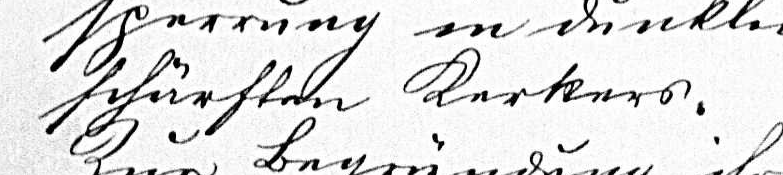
schärften Kerkers.
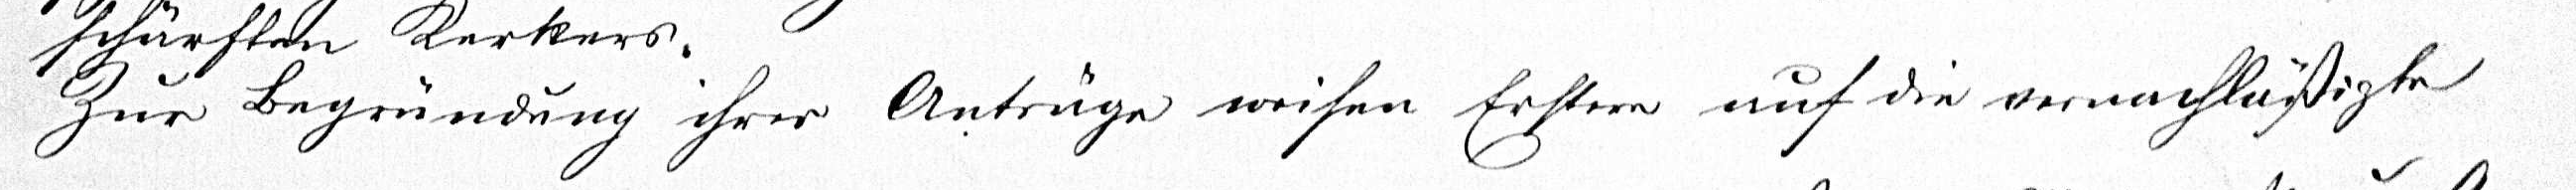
Zur Begründung ihrer Anträge weisen Erstere auf die vernachläßigte
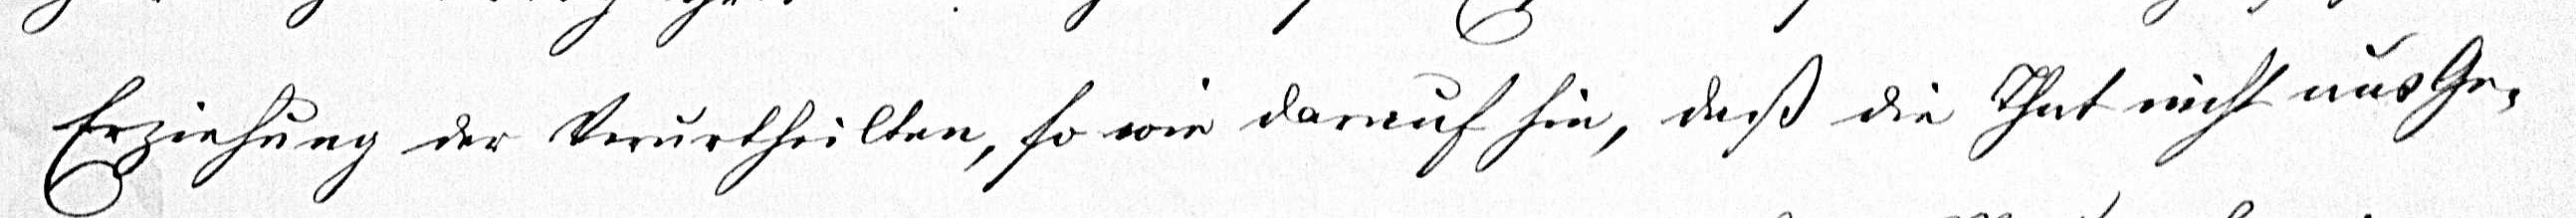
Erziehung der Verurtheilten, so wie darauf hin, daß die That nicht aus Ge¬
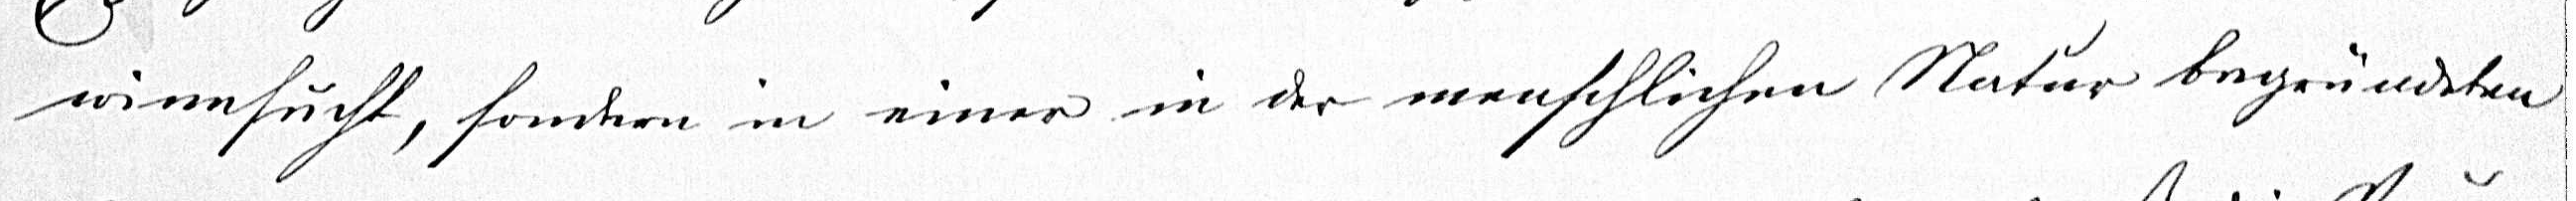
winnsucht, sondern in einer in der menschlichen Natur begründeten
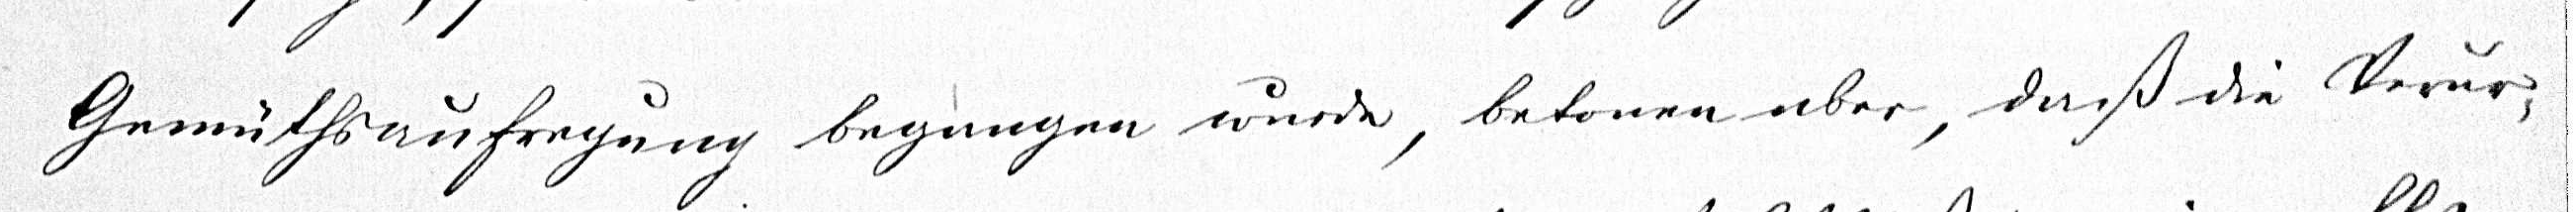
Gemüthsaufregung begangen wurde, betonen aber, daß die Verur¬
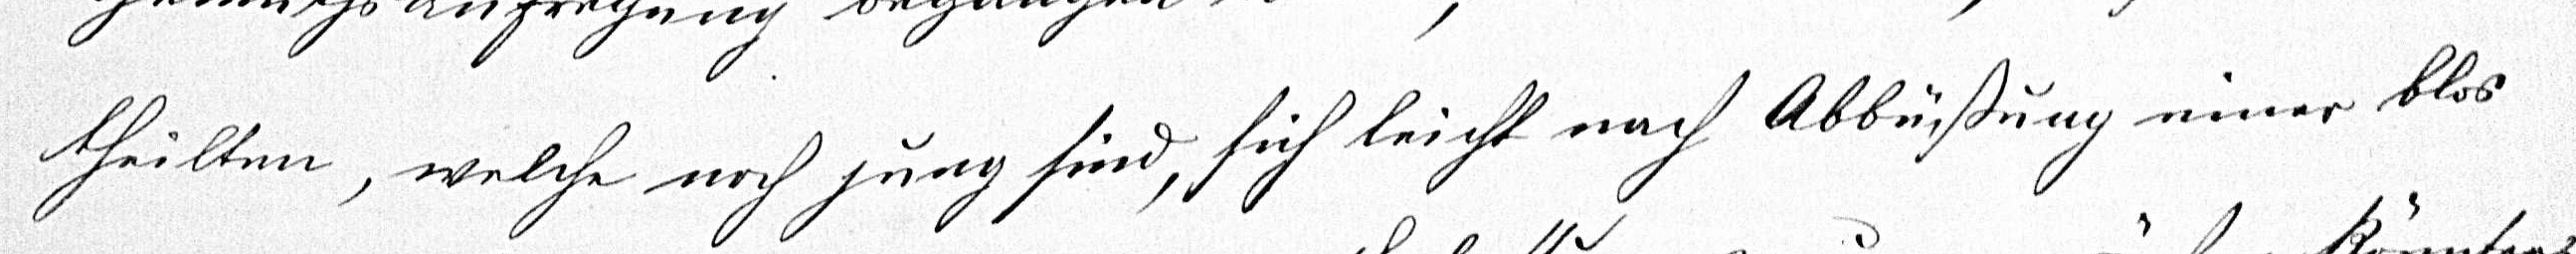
theilten, welche noch jung sind, sich leicht nach Abbüßung einer blos
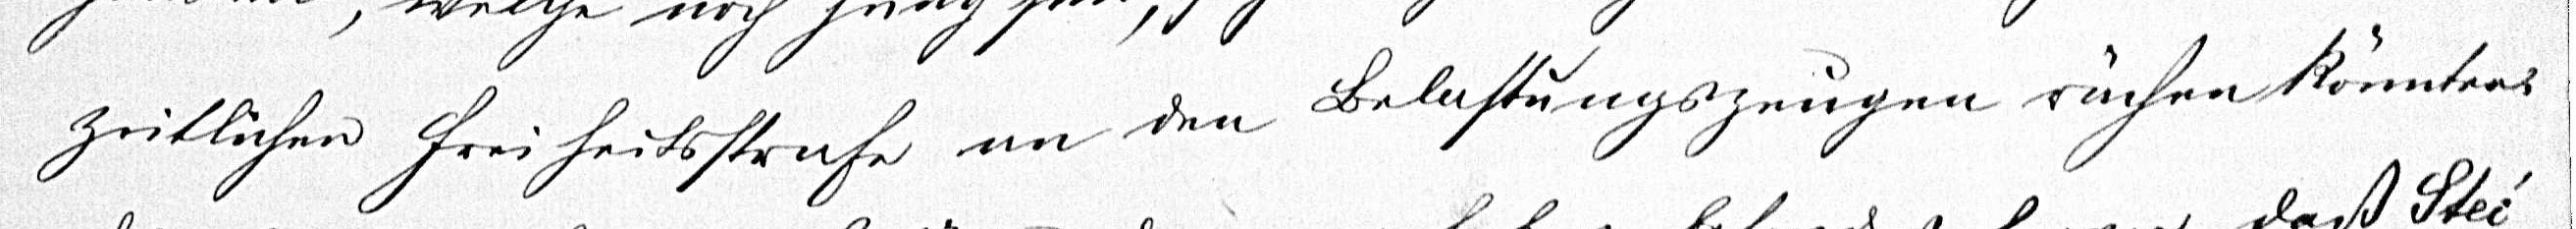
zeitlichen Freiheitsstrafe an den Belastungszeugen rächen könnten.
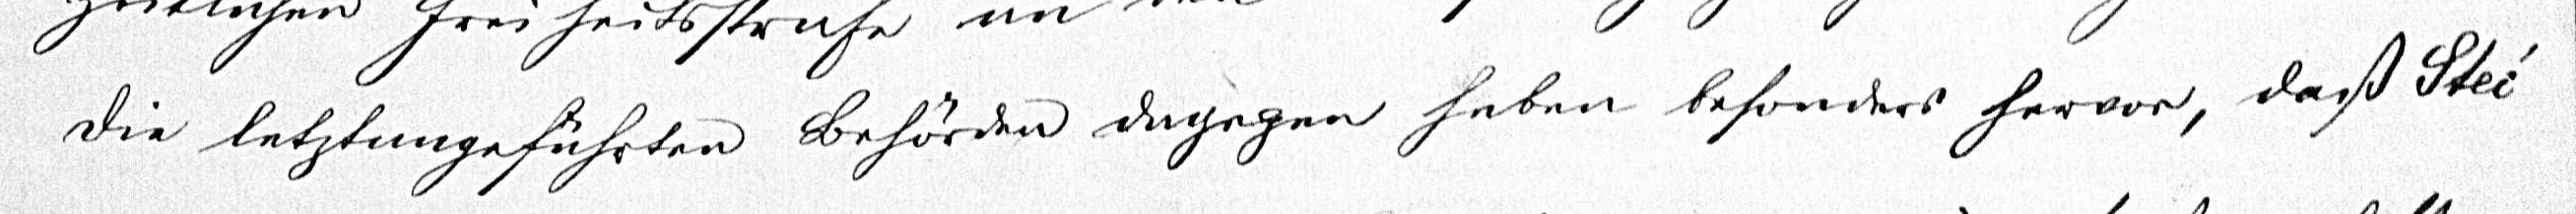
Die letztungeführten Behörden dagegen haben besonders hervon, daß Steć
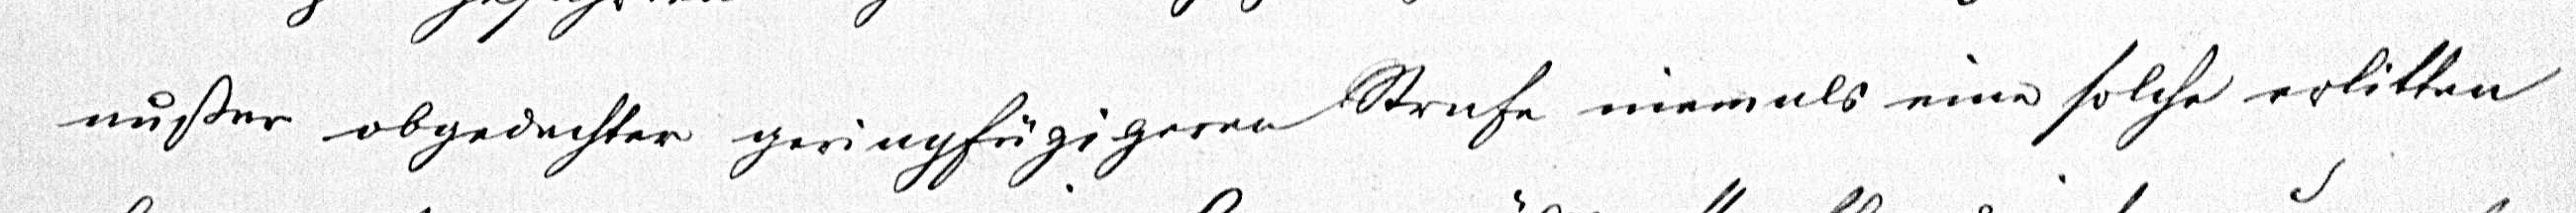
außer obgedachter geringfüzigeren Strafe niemals eine solche erlitten
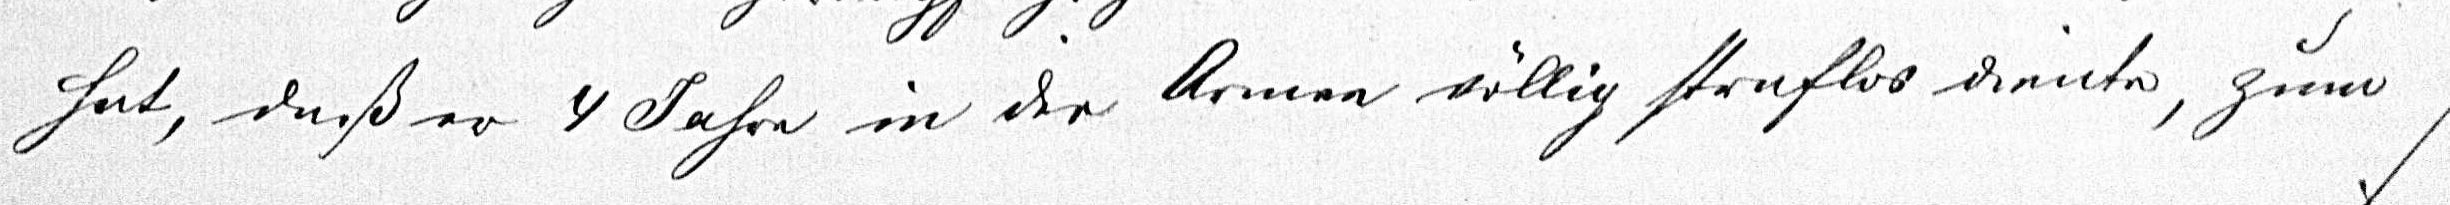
hat, daß er 4 Jahre in die Armee völlig straflos diente, zum
